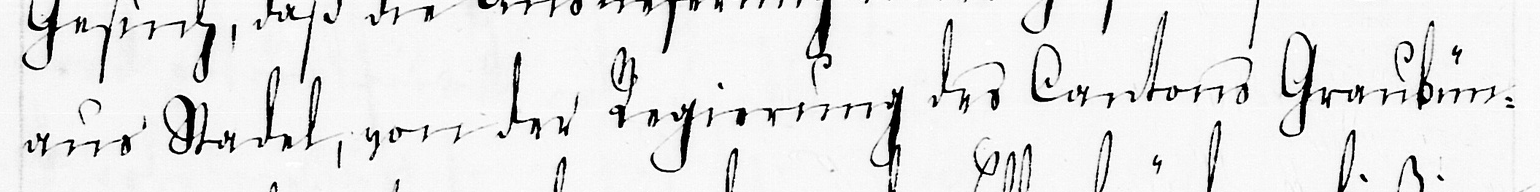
aus Stadel, von der Regierung des Cantons Graubün¬
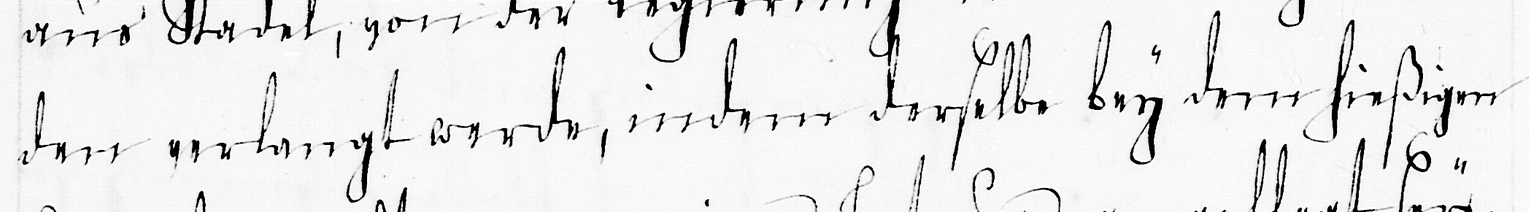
den verlangt werde, indem derselbe bey dem hießigen
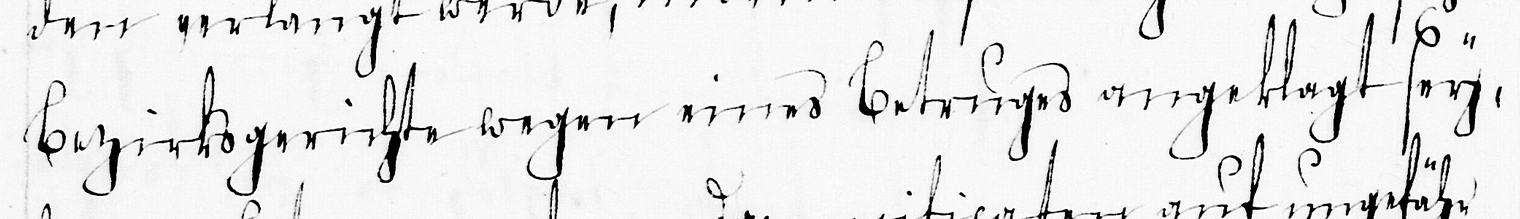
Bezirksgerichte wegen eines Betruges angeklagt sey,
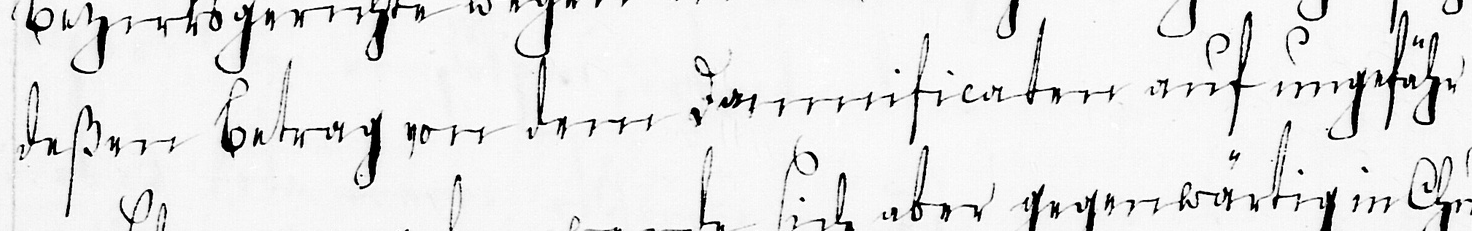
deßen Betrag von dem Damnificaten auf ungefähr
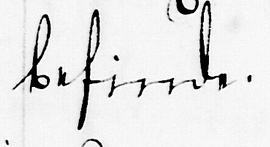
befinde.
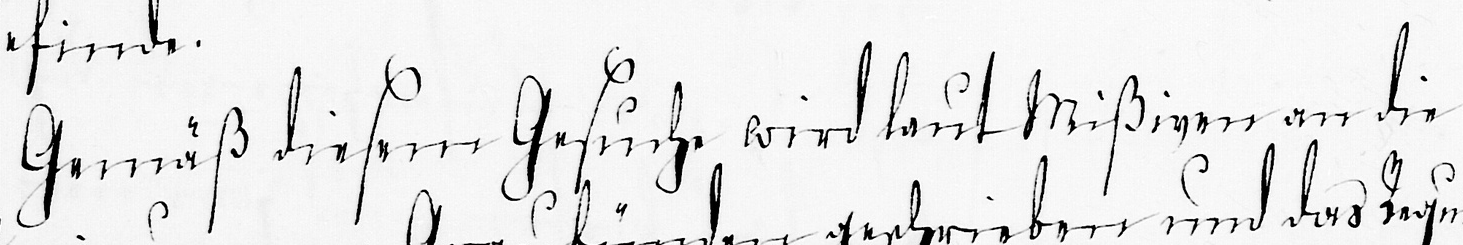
Gemäß diesem Gesuche wird laut Mißiven an die
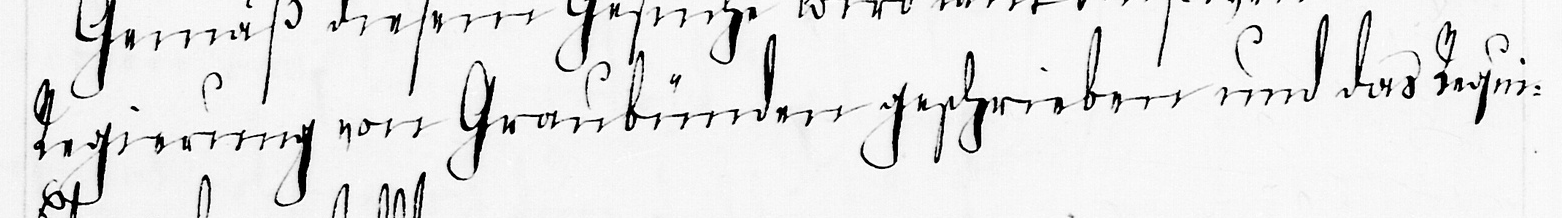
Regierung von Graubünden geschrieben und das Requi¬
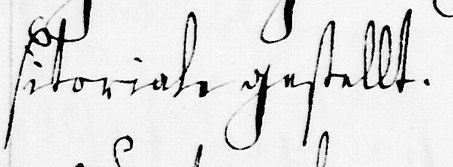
sitoriale gestellt.
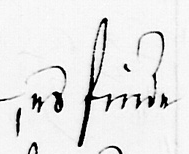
es finde
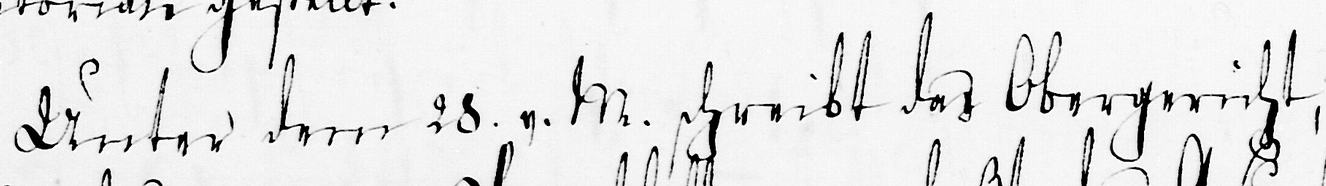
Unter dem 28. v. M. schreibt das Obergericht,
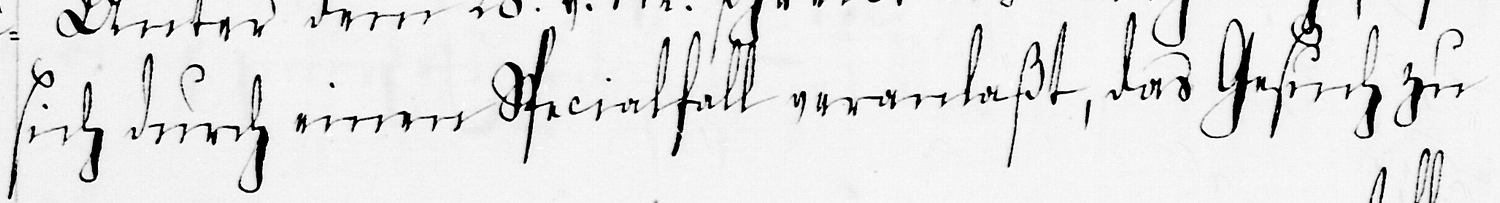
sich durch einen Specialfall veranlaßt, das Gesuch zu
